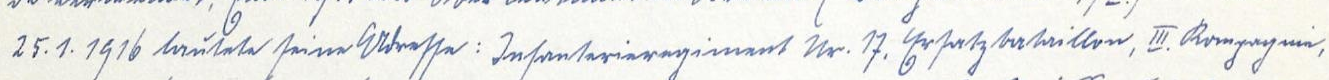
25.1.1916 lautete seine Adresse: Infanterieregiment Nr. 17, Ersatzbataillon, III. Kompanie,
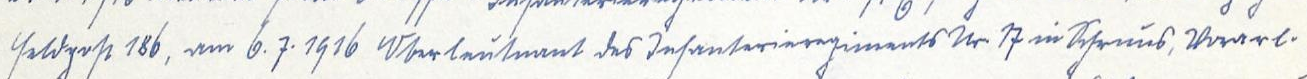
Feldpost 186, am 6.7.1916 Oberleutnant des Infanterieregiments Nr. 17 in Schruns, Vorarl-
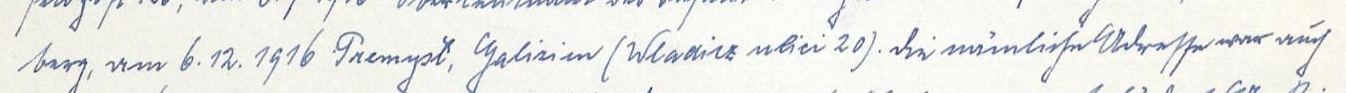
berg, am 6.12.1916, Premysl Galizien (Wladicz ulici 20). Die nämliche Adresse war auch
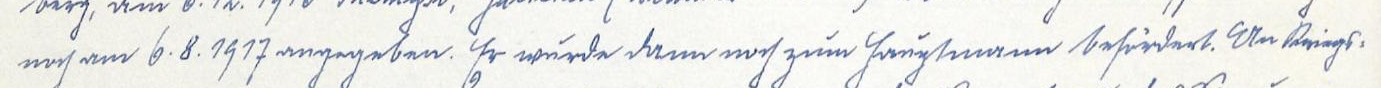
noch am 6.8.1917 angegeben. Er wurde dann noch zum Hauptmann befördert. An
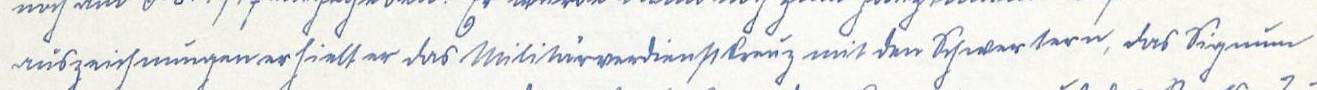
Kriegsauszeichnungen erhielt er das Militärverdienstkreuz mit den Schwertern, das Signum
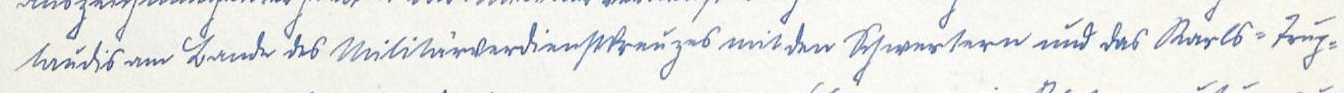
laudis am Bande des Militärverdienstkreuzes mit den Schwertern und das Karls-Trup-
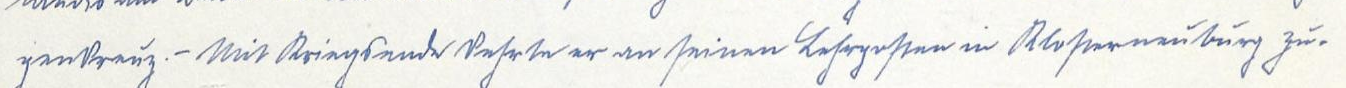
penkreuz. Mit Kriegsende kehrte er an seinen Lehrerposten in Klosterneuburg zu-
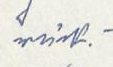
rück.
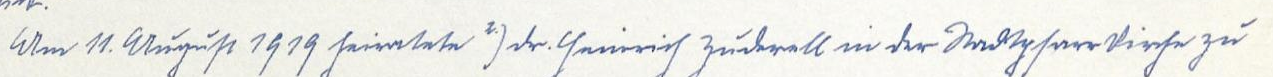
Am 11. August 1919 heiratete 2) Dr. Heinrich Zuderell in der Stadtpfarrkirche zu
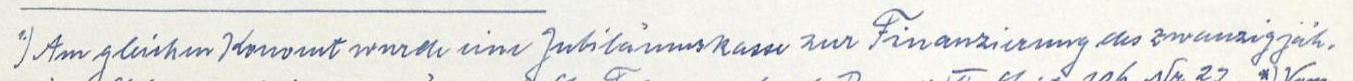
1) Am gleichen Konvent wurde eine Jubiläumskasse zur Finanzierung des zwanzigjäh-
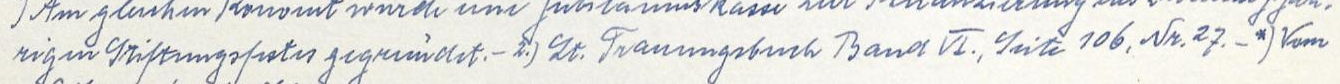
rigen Stiftungsfestes gegründet. 2) Laut Trauungbuch Bd. VI., Seite 106, Nr. 27.- 3) Vom WS 1901/02 bis SS 1902.
